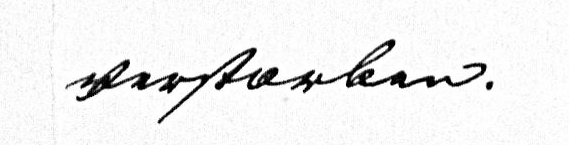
verstorben.
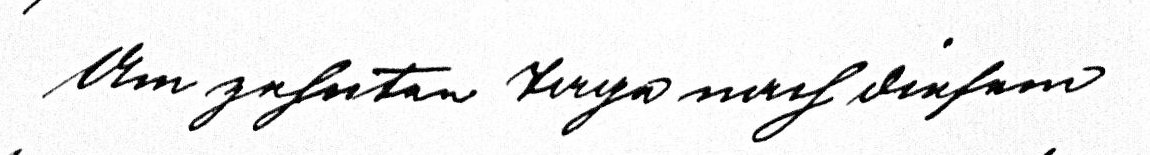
Am zehnten Tage nach diesem
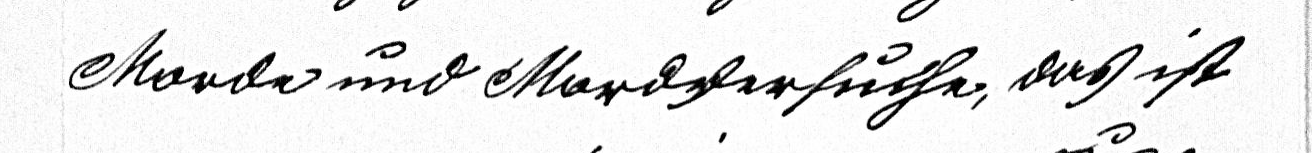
Morde und Mordversuche, das ist
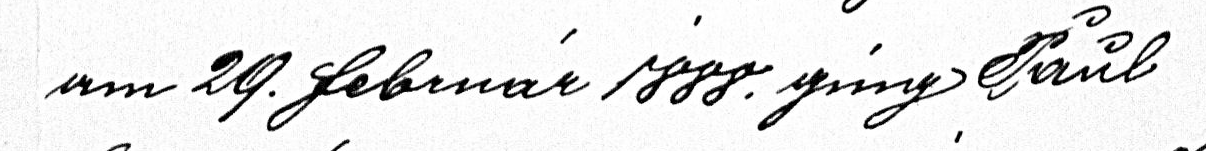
am 29. Február 1888. ging Paul
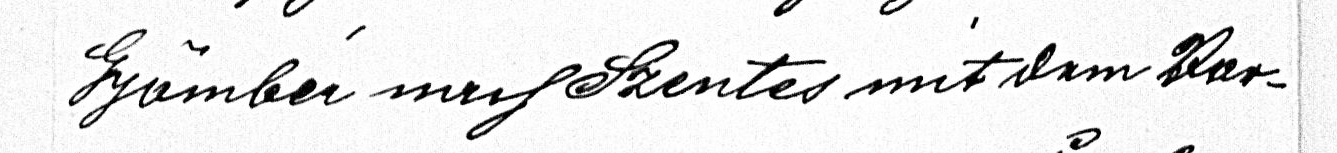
Gyömbér nach Szentes mit dem Vor¬
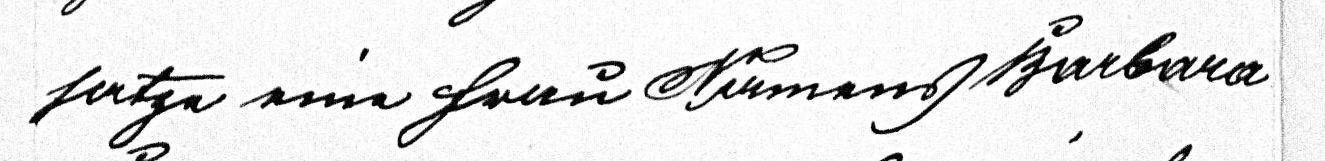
satze eine Frau Namens Barbara
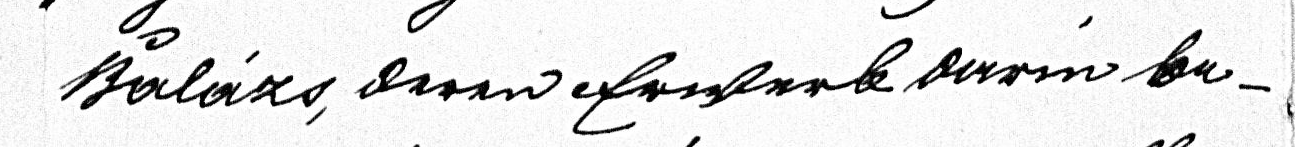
Balázs, deren Erwerk darin be¬
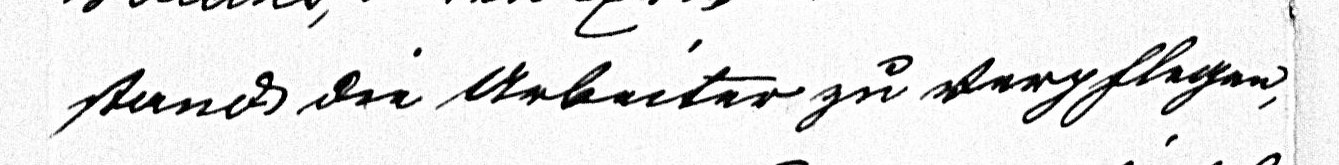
stand die Arbeiter zu verpflegen,
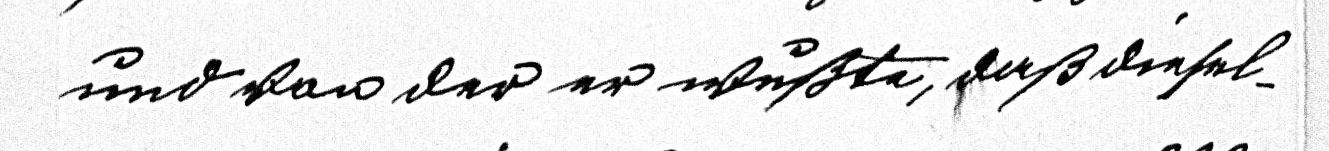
und von der er wußte, daß diesel¬
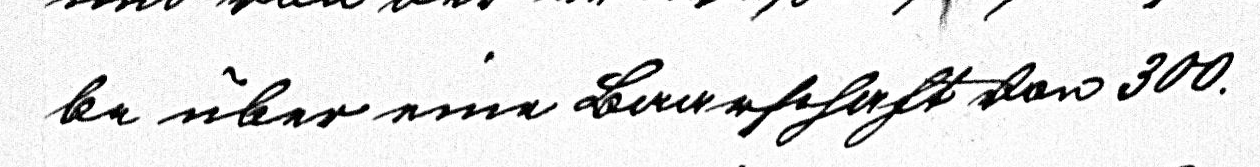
be über eine Baarschaft von 300.
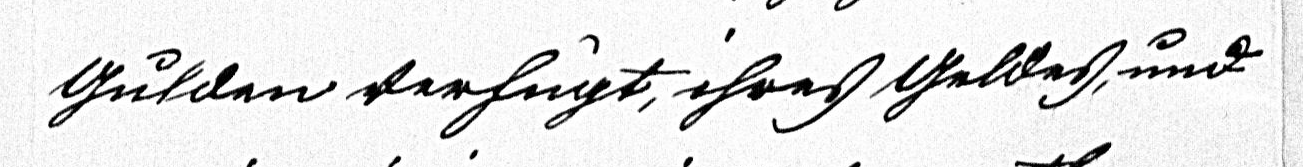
Gulden verfugt, ihres Geldes, und
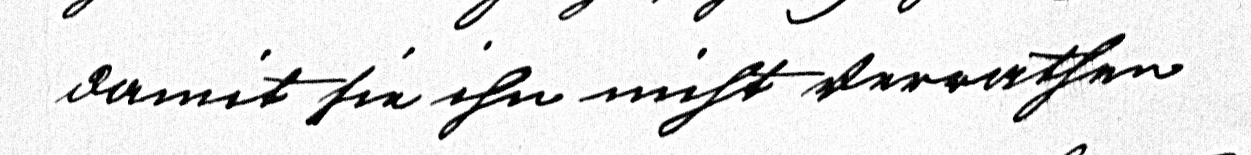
damit sie ihn nicht verrathen
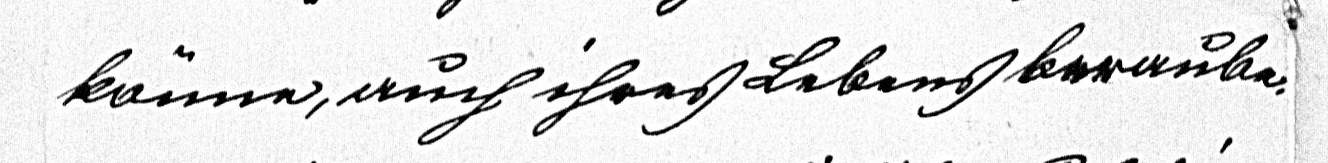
könne, auch ihres Lebens beraube.
